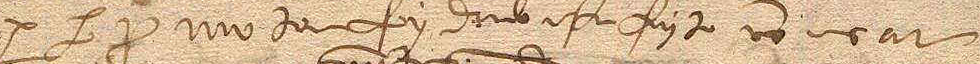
ꝑ ho ꝓmotor foy dado este feyto c̄o os ar
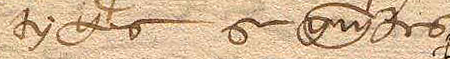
tygos seḡujtes
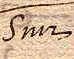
S̄nor
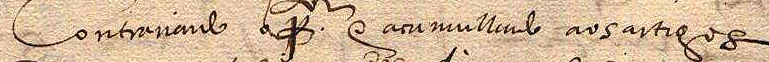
Contrariando o ꝓtor. e acumullando aos artigos
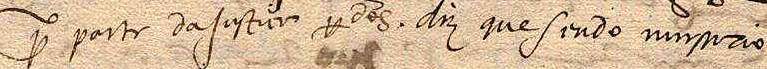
p̄o parte da Justica Rdos. diz que sendo necessario
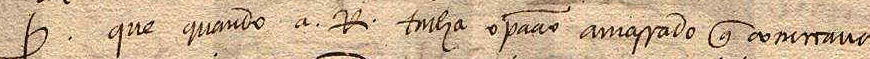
Pra. que quando a .R. tinha o paão amassado q̄ comecaua
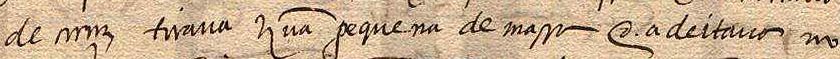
de creçer tiraua hūa pequena de massa e. a deitaua no
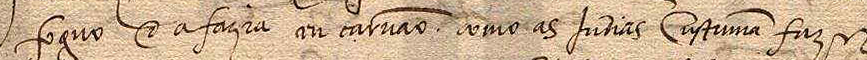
foguo e a fazia en caruão. como as Judias Custumā fazer
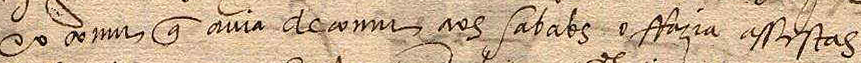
e o comer q̄ auia de comer aos sabados o ffazia assestas
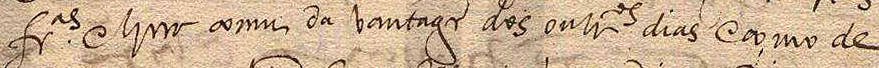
fras. e hera comer da vantagē dos outros dias e como de
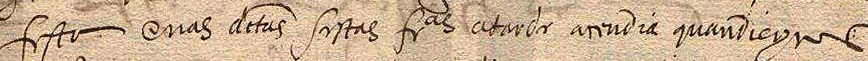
festa e nas dc̄tas sestas fras a tarde acendia quandieyros
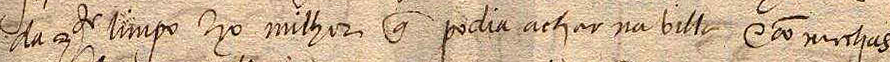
dazte limpo ho milhor q̄ podia achar na villa e c̄o mechas
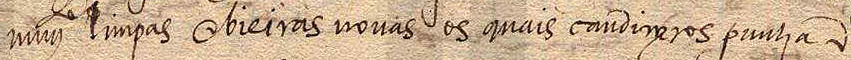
muyto limpas e vieiras nouas os quais candieyros punha ē
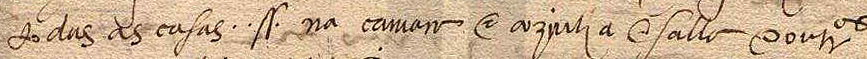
todas as casas. .ss. na camara e cozinha e salla e outros
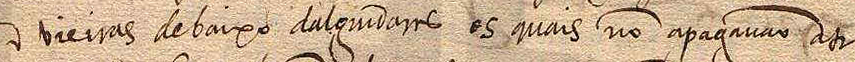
ē vieiras debaixo dalguidares os quais n̄o apagauão ate
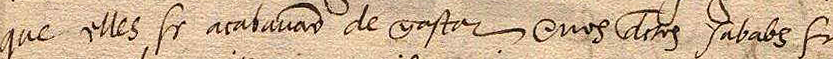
que elles se acabauão de gastar e nos d̄ctos sabados se
